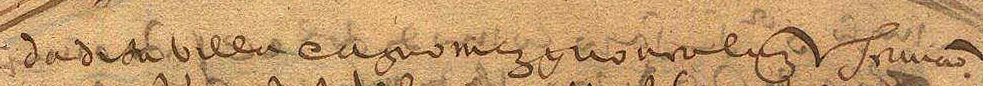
da dita villa e a guomez guonçaluz̄ scriuaõ
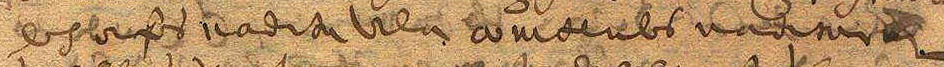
dos orfos na dita vila comteudos na dita car
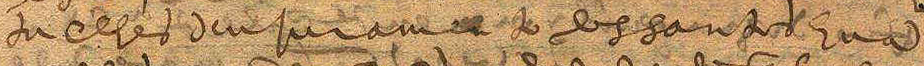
ta e lhes deu Juramēto dos santos Euā
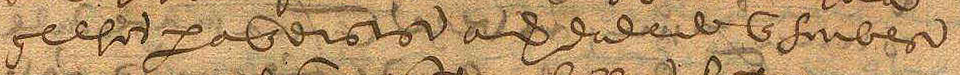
gelhos ꝑa q̄ disesē a ꝟdade do q̄ soubesē
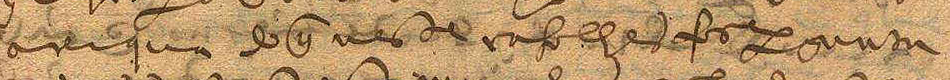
acerqua do q̄ neste caso lhe fose ꝑgunta
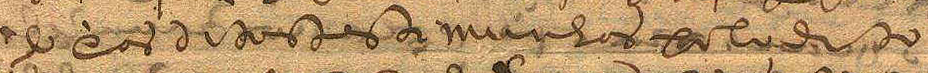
do e as ditas testemunhas polo dito
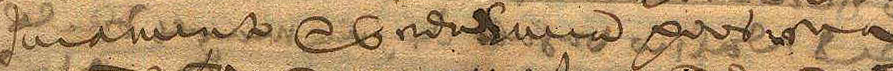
Juramento ē q̄ cada huuā poos sua
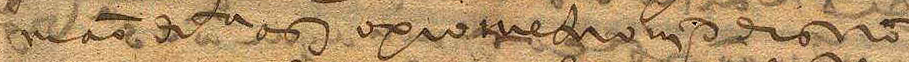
mão drta asj o prometerom e diserō
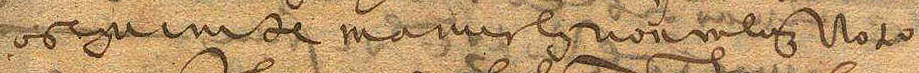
o seguimte manuel guonçaluz̄ Noto
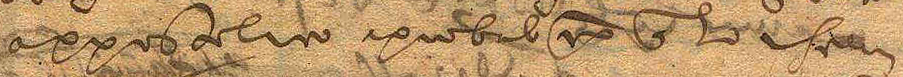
appostolico aprobado c̄ꝭ q̄ ho escreuj
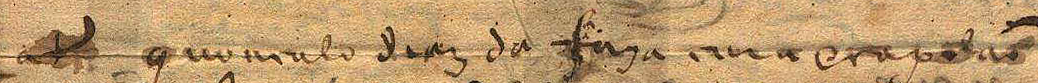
item guonçalo diaz da faya cura e capelaõ
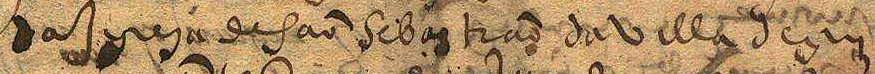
da Jgreja de saõ Sebastião da villa de gui
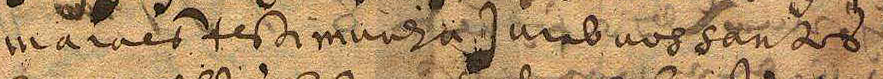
maraẽs testemunha Jurado aos santos
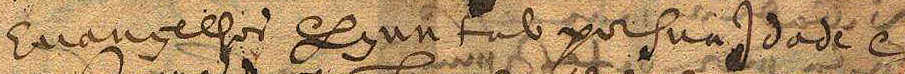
Euangelhos e ꝑguntado por sua Jdade e
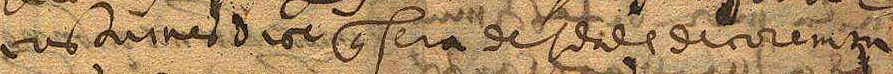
custumes dise q̄ sera de jdade de coremta
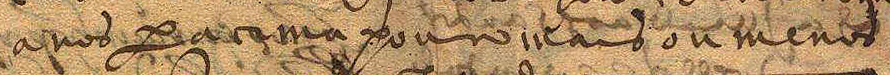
anos ꝑa cima pouco mais ou menos
